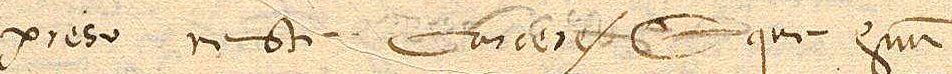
preso neste Carcere / E que hu̅u
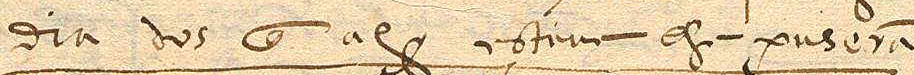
dia dos q̅ ahy esteue lhe puserā
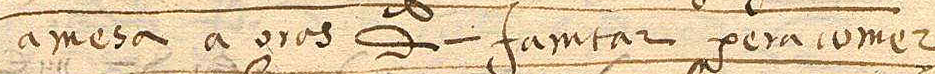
a mesa a oras de Jamtar pera comer
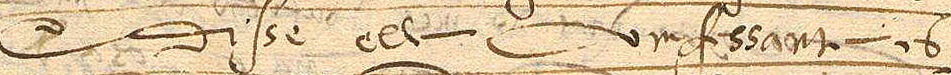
e disse elle Comfessante es
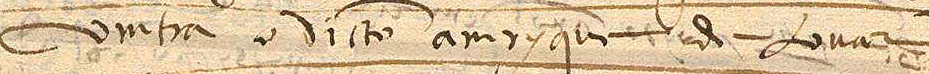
Comtra o di̅cto amryque de touar
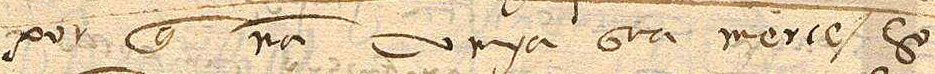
por q̅ n̅a comya sua merce / ho
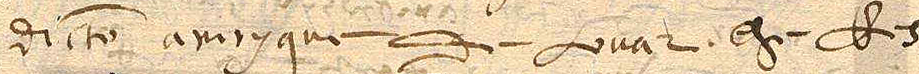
dic̅to amryque de touar lhe Res
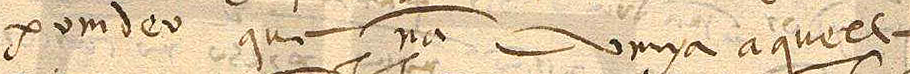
pomdeo que n̅a Comya aquelle
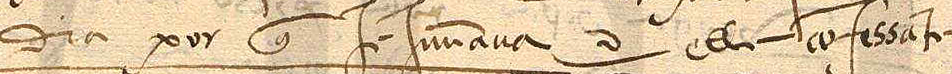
dia por q̅ JeJu̅uaua e elle c̅ofessa̅te
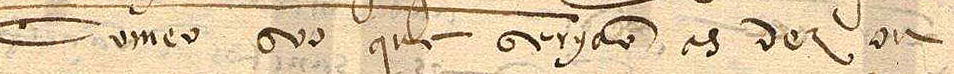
Comeo soo que seryaõ as dez ou
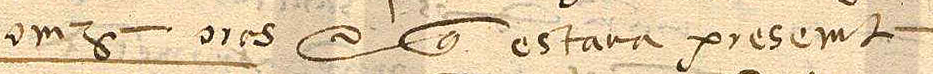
omze oras e q̅ estaua presemte
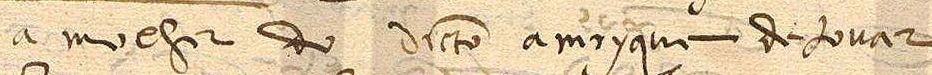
a molher do di̅cto amryque de touar
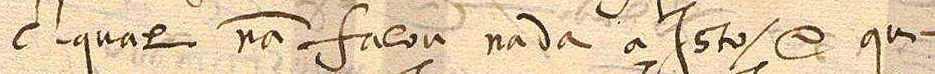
A quaL n̅a falou nada a Jsto / e que
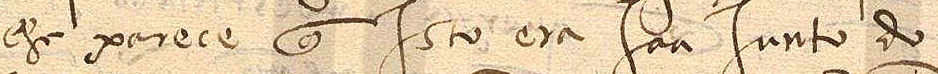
lhe parece q̅ Jsto era Jaa Junto do
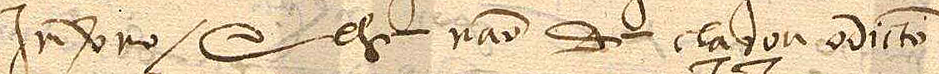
Jmꝟno / e lhe na̅o declarou o di̅cto
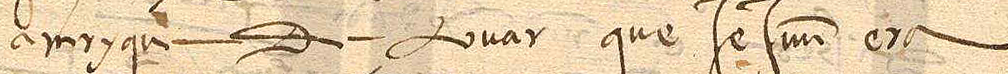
amryque de touar que JeJu̅u era
